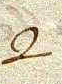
2
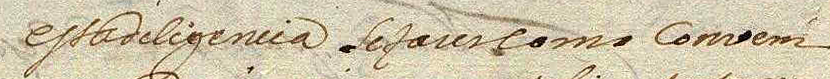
esta deligencia se fazer como convem
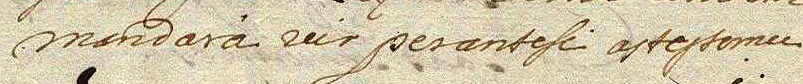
mandará vir perante si as testemu
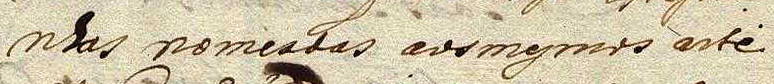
nhas nomeadas aos mesmos arti
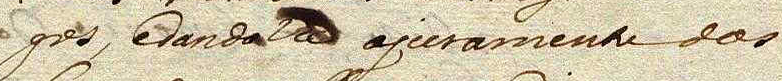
gos, e dandolhe o juramento dos
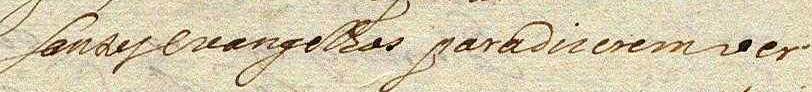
santos evangelhos para dizerem ver
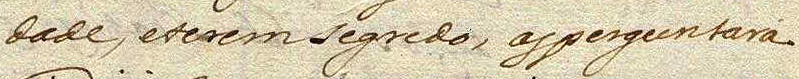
dade, e terem segredo, as perguntara
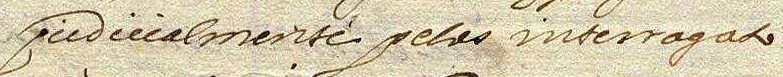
judicialmente pelos interrogato
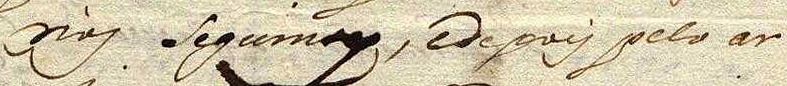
rios seguintes, e depois pelo ar
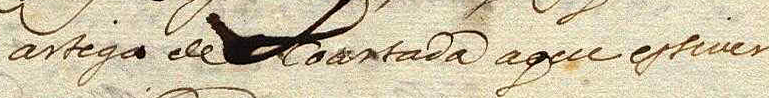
artigo de Coartada a que estiuer
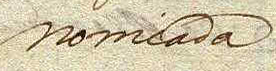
nomiada
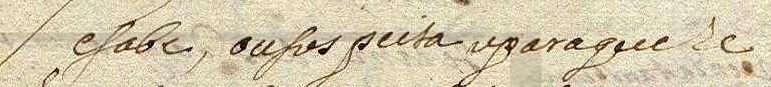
Se sabe, ou sospeita o para que he
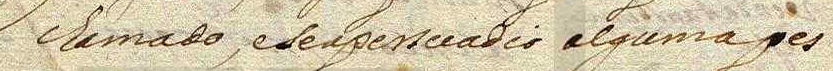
chamado, e se a persuadio alguma pes
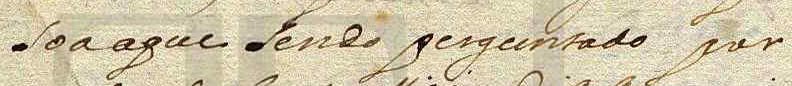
soa a que sendo perguntado por
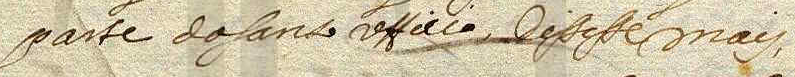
parte do santo officio dissesse mais,
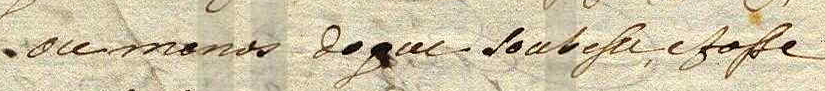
ou menos do que soubesse, e fosse
